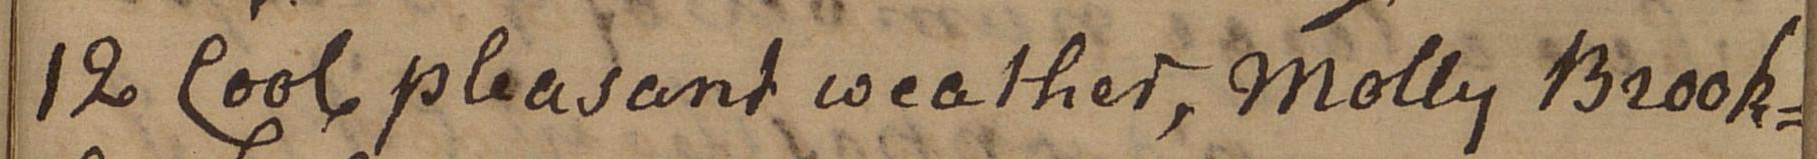12 Cool pleasant weather, Molly Brook-
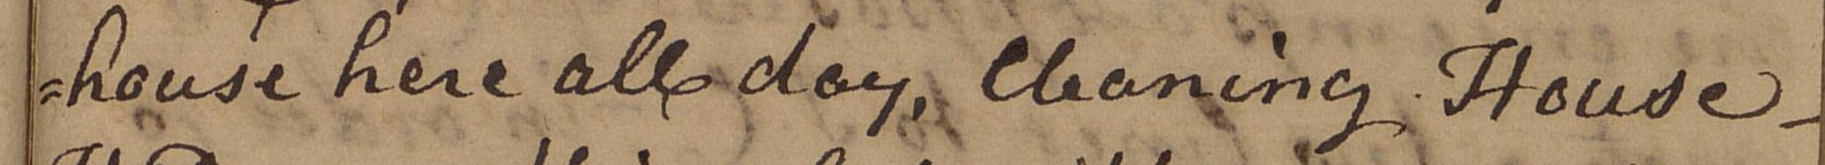-house here all day, Cleaning. House-
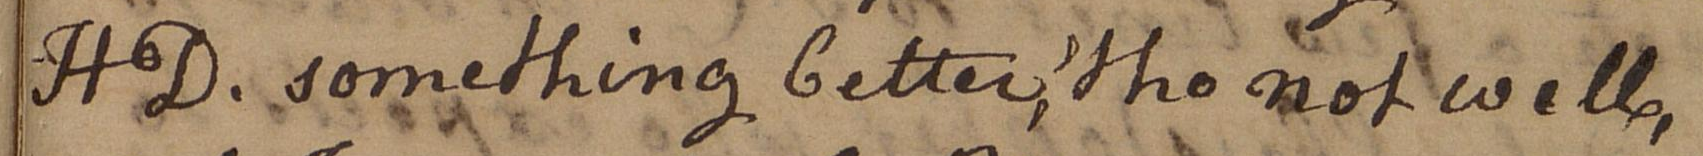H D. something better, 'tho not well,
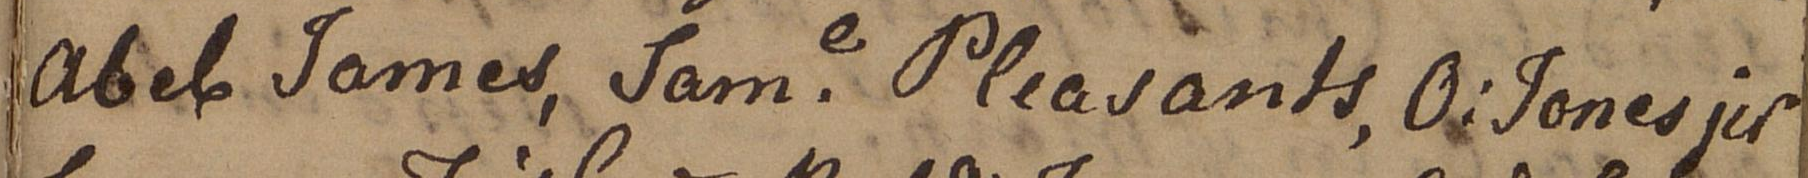Abel James, Sam^l. Pleasants, O: Jones jur
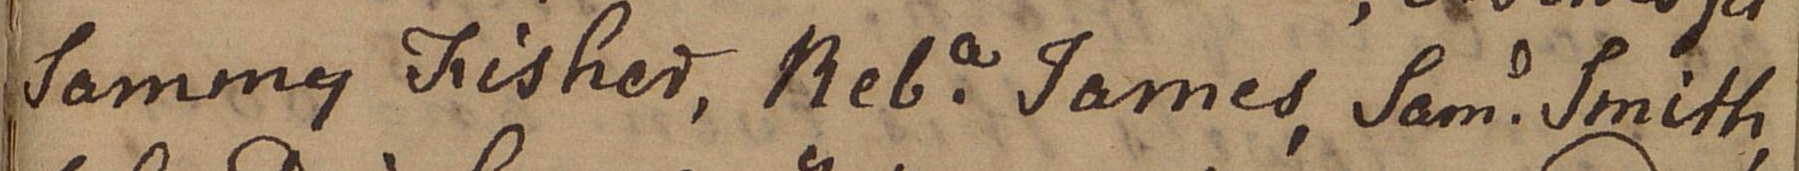Sammy Fisher, Reb^a. James, Sam^l. Smith,
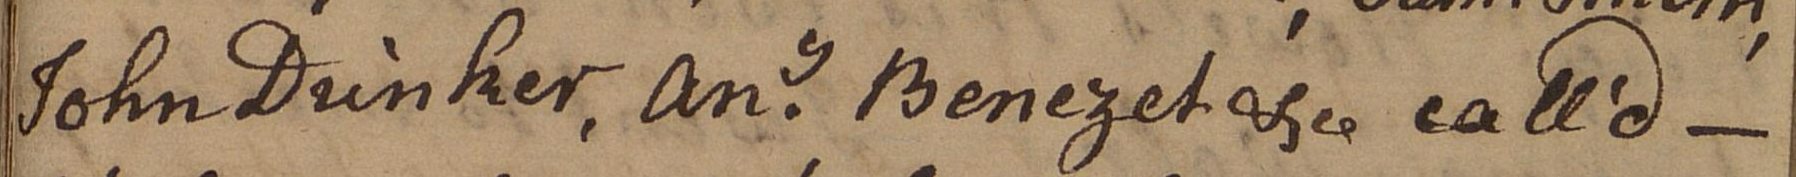John Drinker, An^y. Benezet &c call'd-
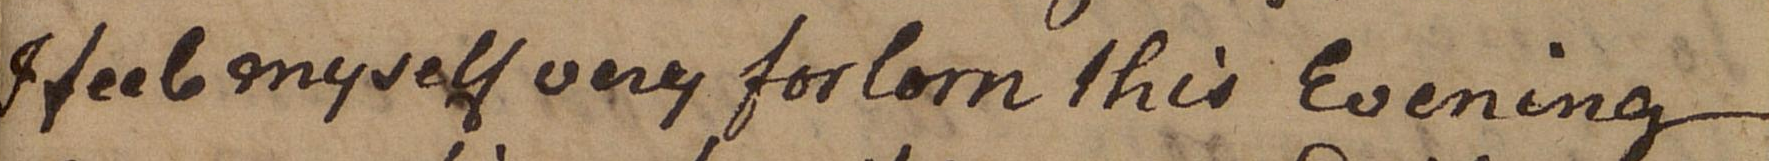I feel myself very forlorn this Evening
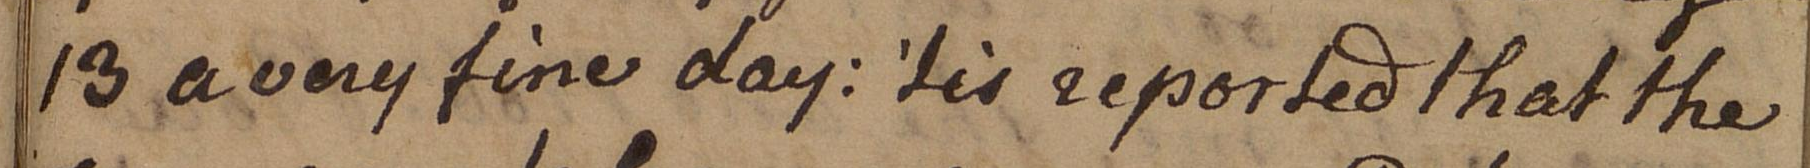13 a very fine day: 'tis reported that the
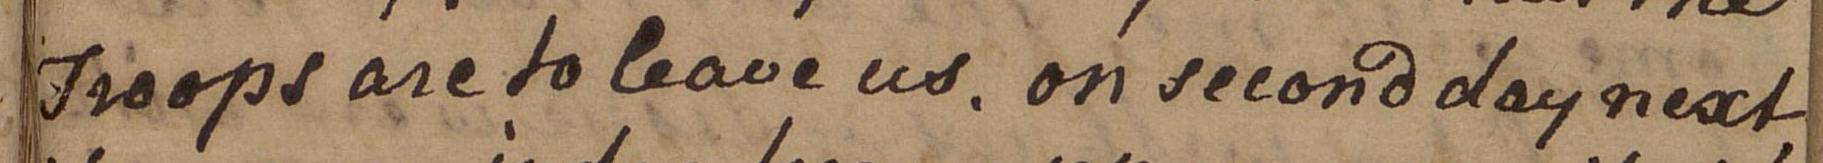Troops are to leave us, on second day next,
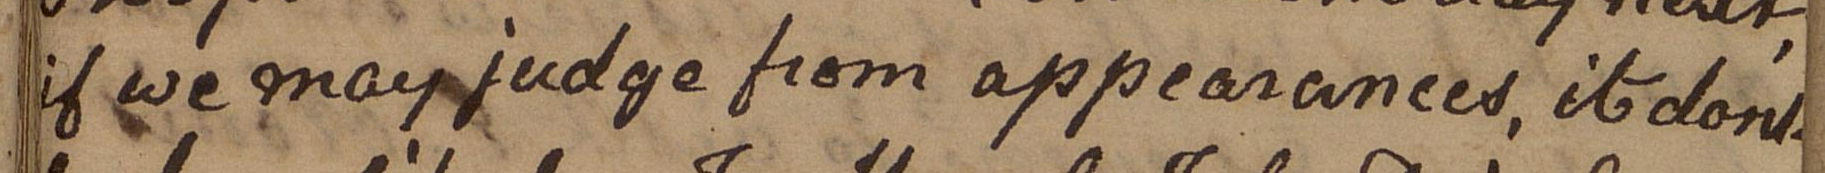if we may judge from appearances, it don't
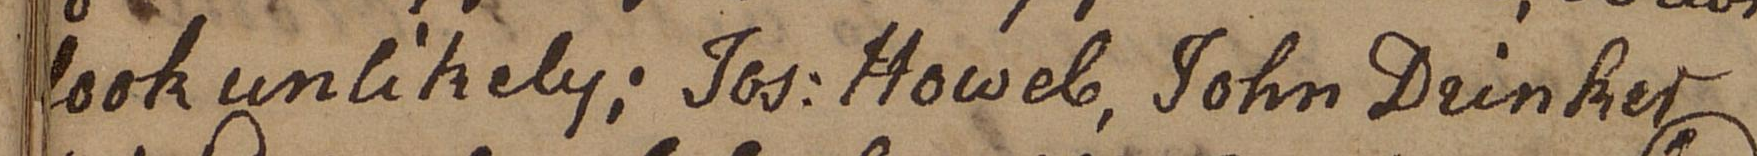look unlikely; Jos: Howel, John Drinker,
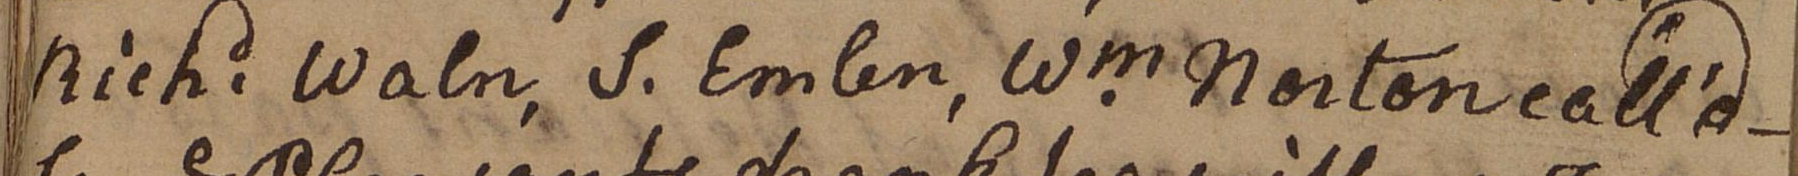Rich^d. Waln, S. Emlen, W^m. Norton call'd-
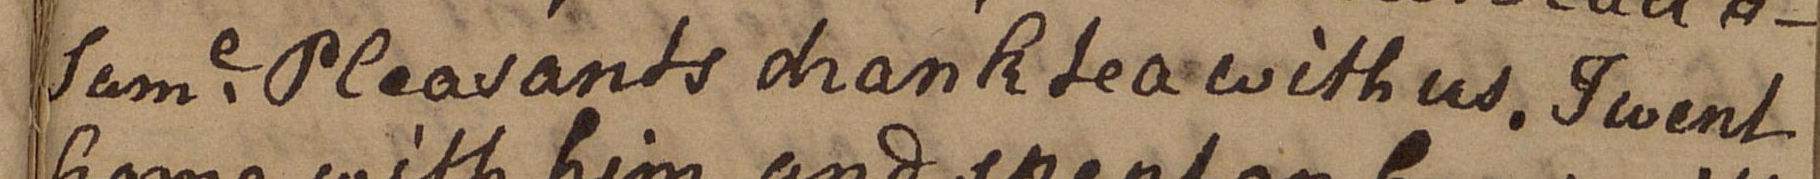Sam^l. Pleasants drank tea with us. I went
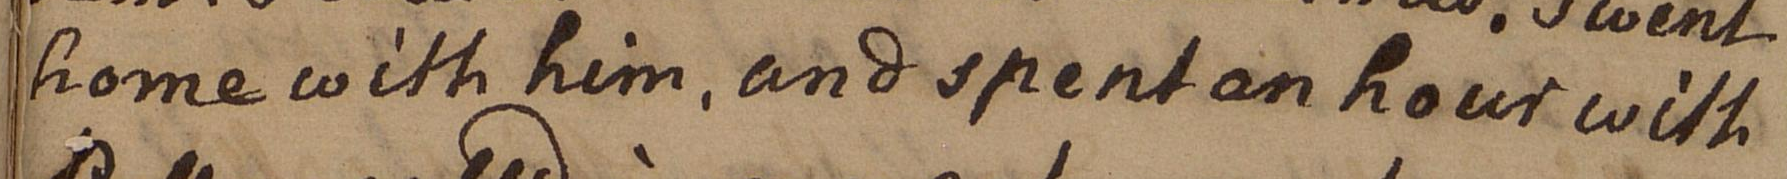home with him, and spent an hour with
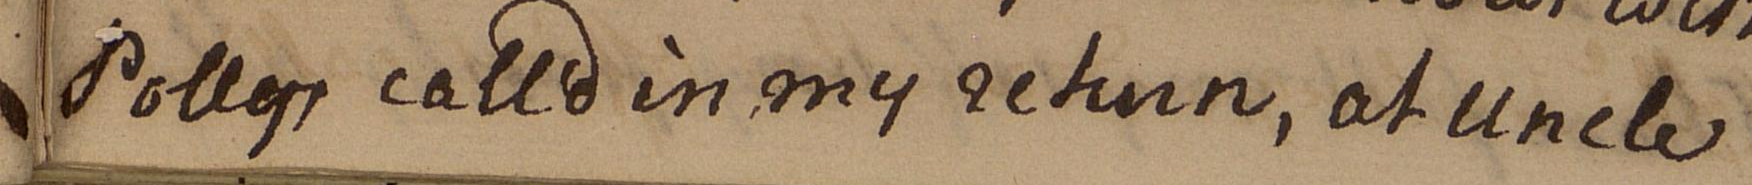Polly call'd in my return, at Uncle
